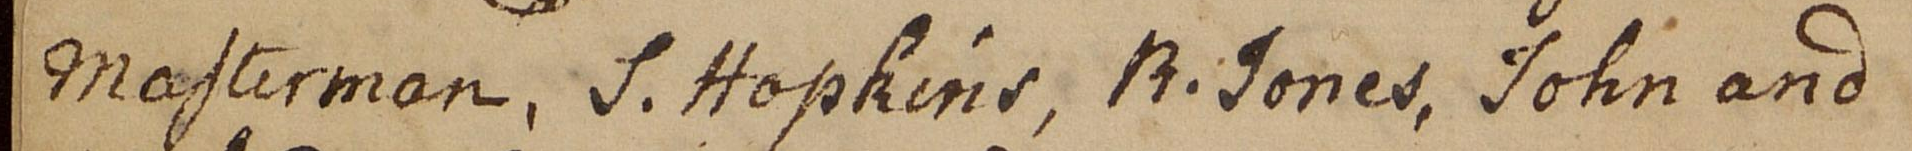Masterman, S. Hopkins, R. Jones, John and
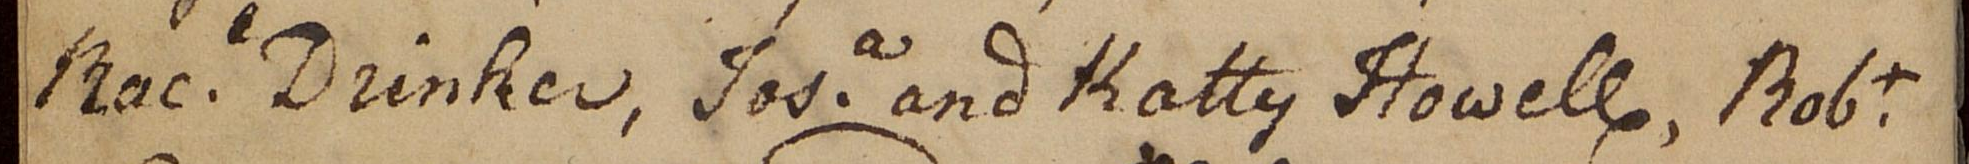Rac^l. Drinker, Jos^a. and Katty Howell, Rob^t.
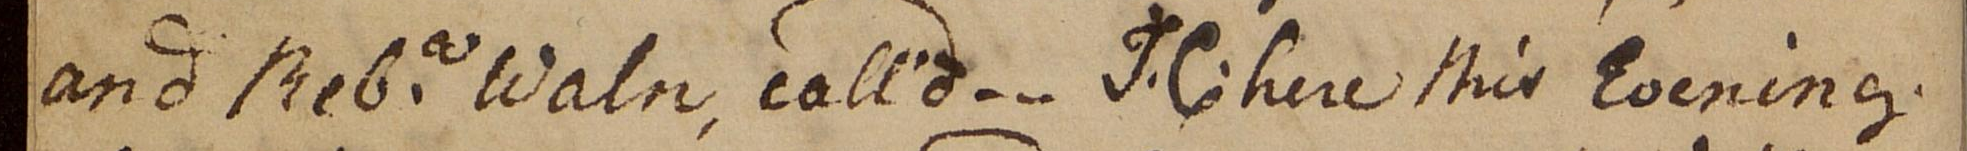and Reb^a. Waln call'd-- I.C. here this Evening
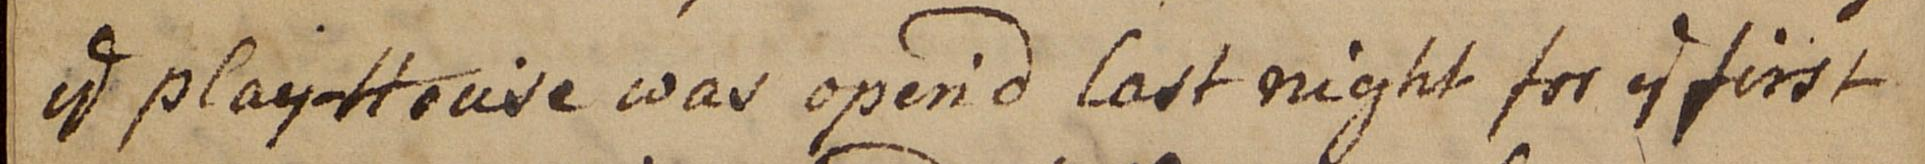y^e play-House was open'd last night for y^e first
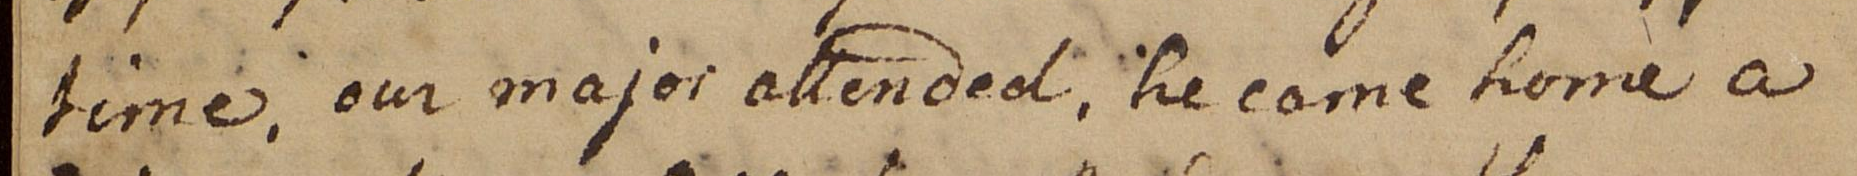time, our major attended, he came home a
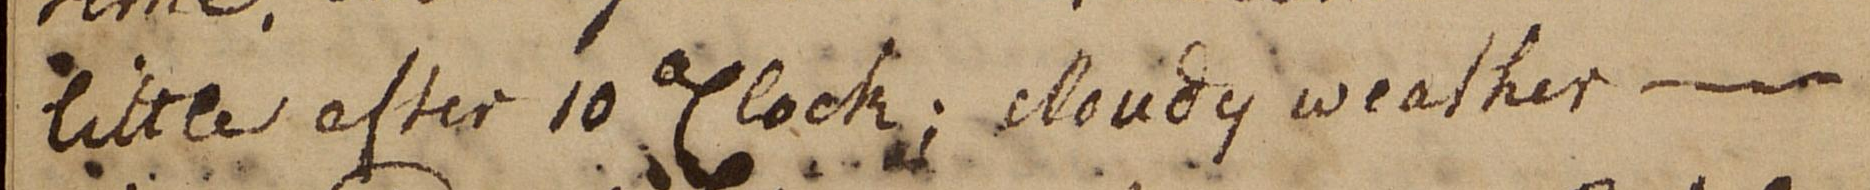little after 10 ^oClock; cloudy weather-
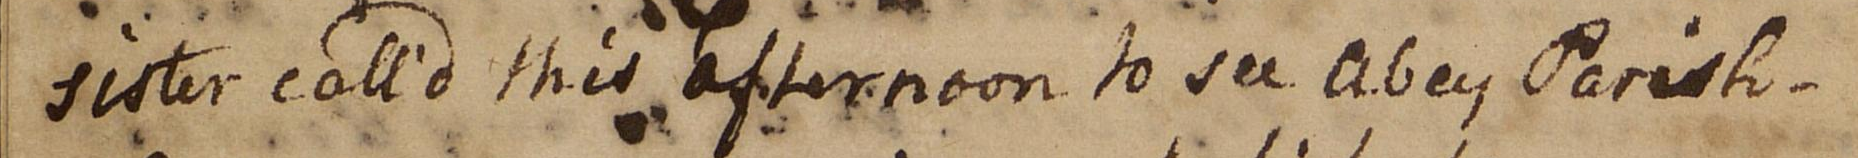sister call'd this afternoon to see Abey Parish-
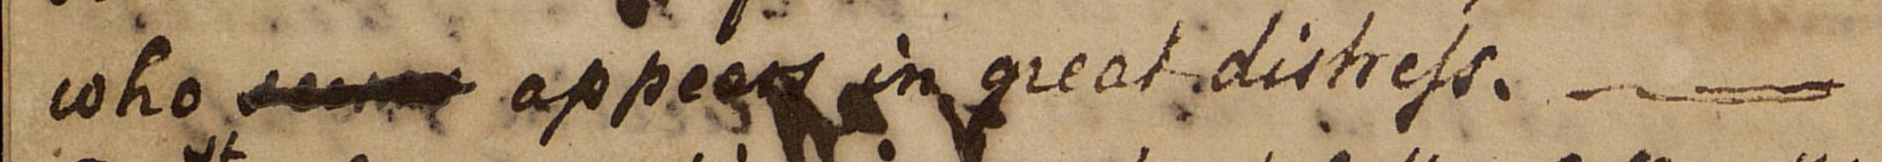who [seems] appears in great distress.-
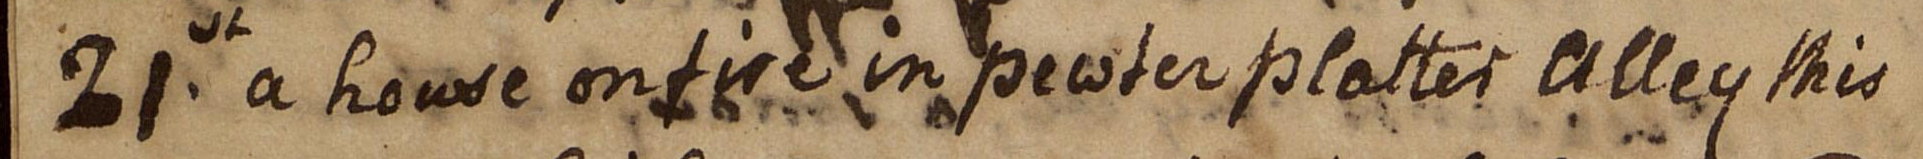21^st. a house on fire in pewter platter Alley this
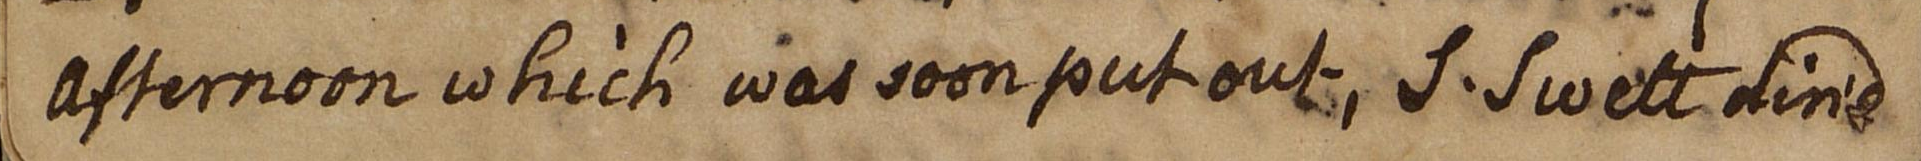Afternoon which was soon put out; S. Swett din'd
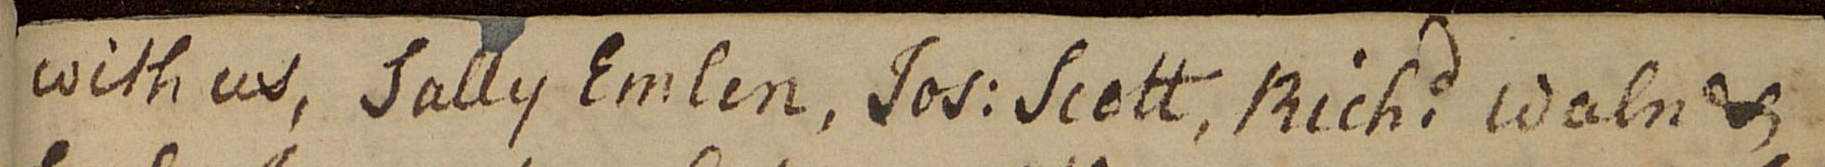with us, Sally Emlen, Jos: Scott, Rich^d Waln &
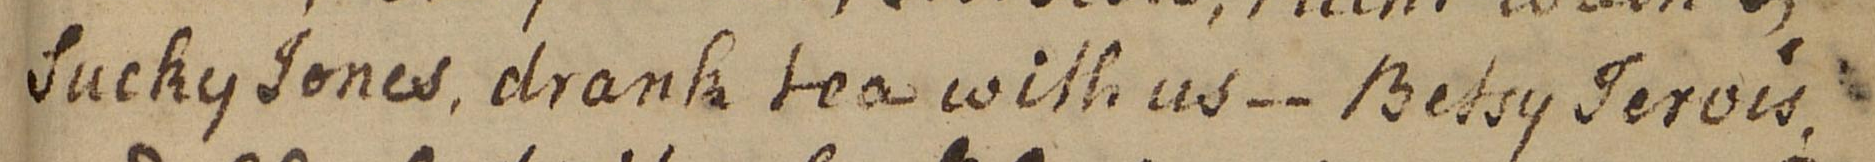Sucky Jones, drank tea with us-- Betsy Jervis,
